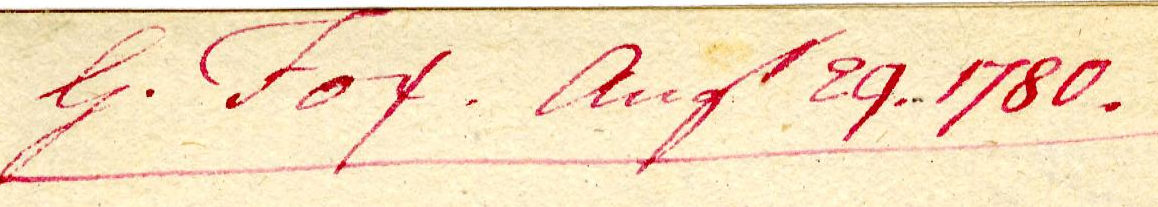G. Fox. Aug^t 29. 1780.
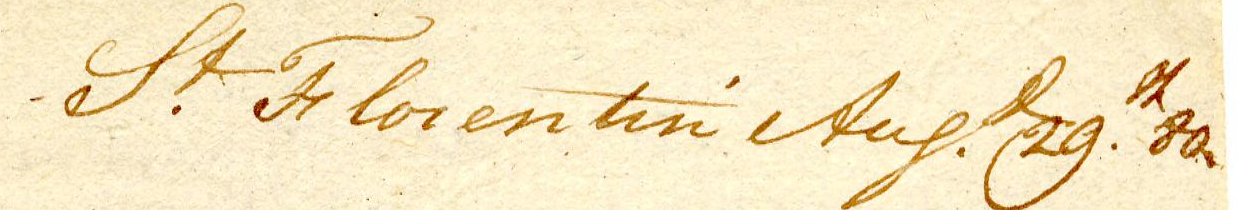S^t. Florentin Aug^t. 29^th. 80
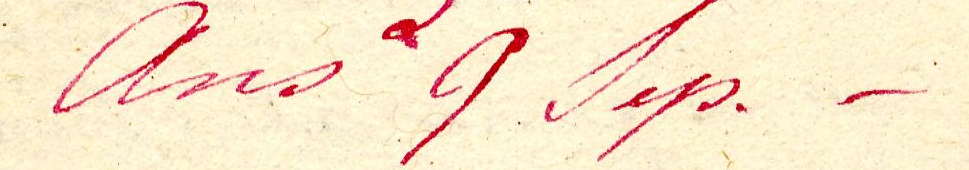Ans^d. 9 Sep.-
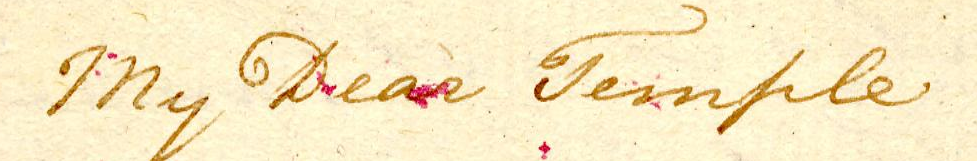My Dear Temple
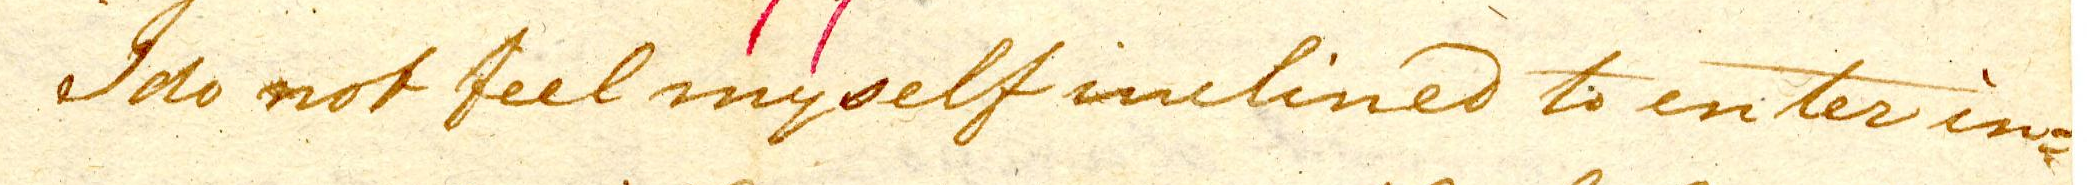I do not feel myself inclined to enter in
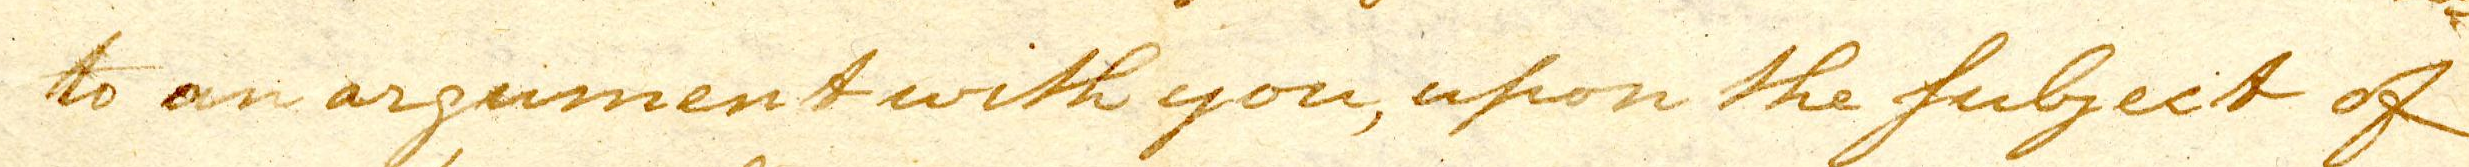to an argument with you, upon the subject of
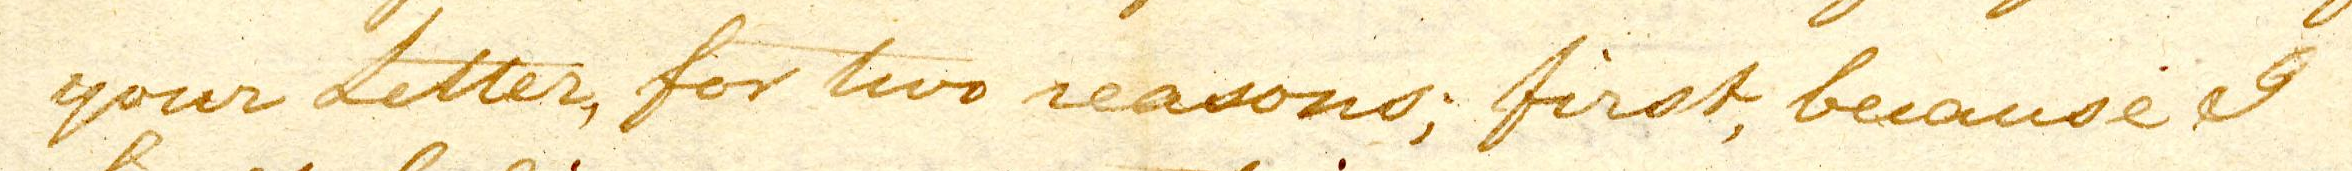your Letter, for two reasons; first, because I
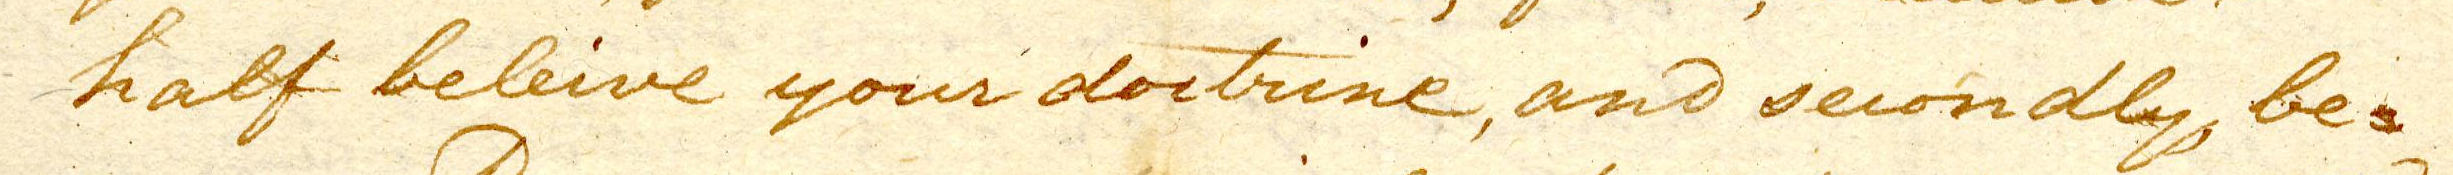half beleive your doctrine, and secondly, be-
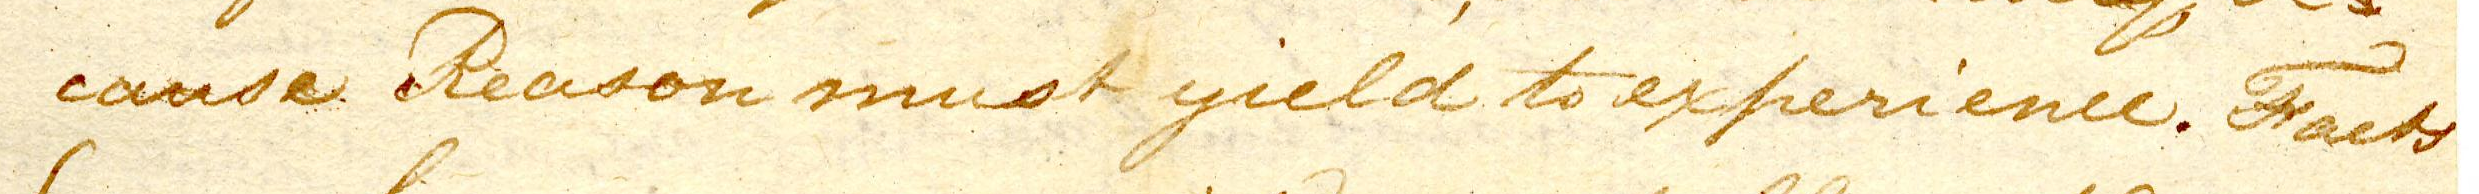cause Reason must yield to experience. Facts
